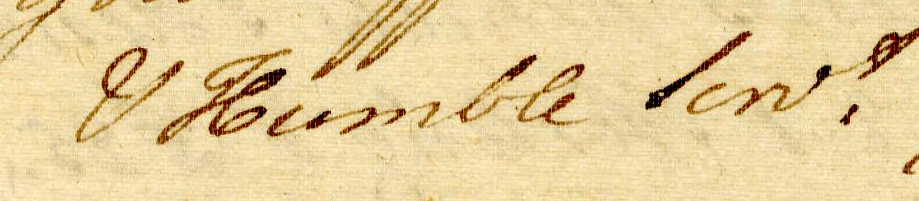& Humble Sen^t.
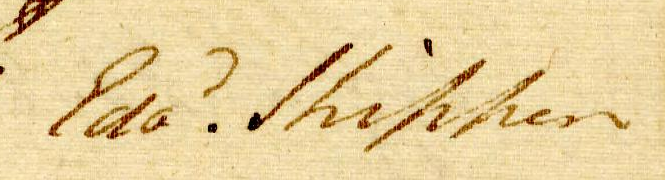Edo^d. Shippen
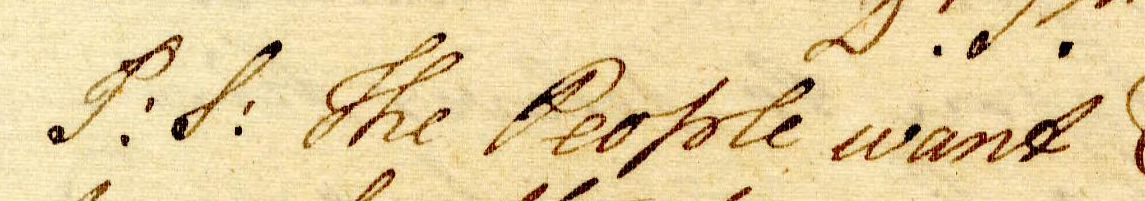P:S: The People want
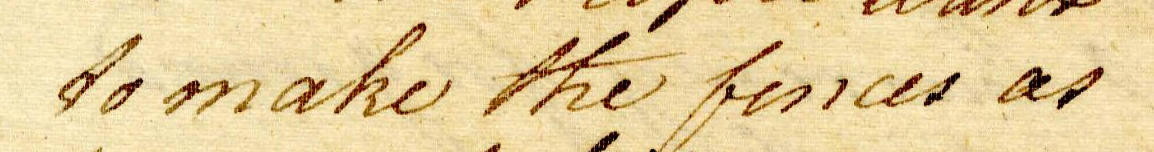to make the fences as
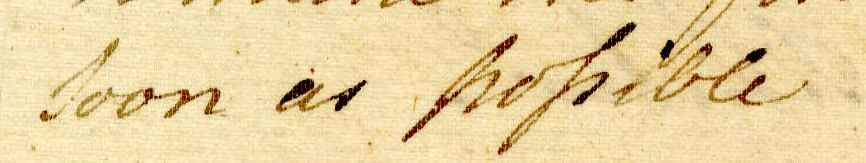soon as possible
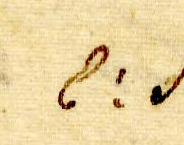E:S
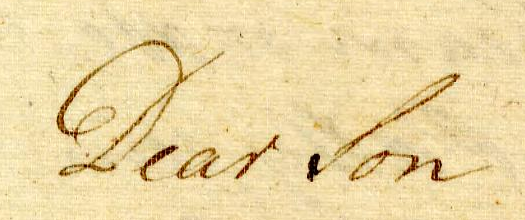Dear Son
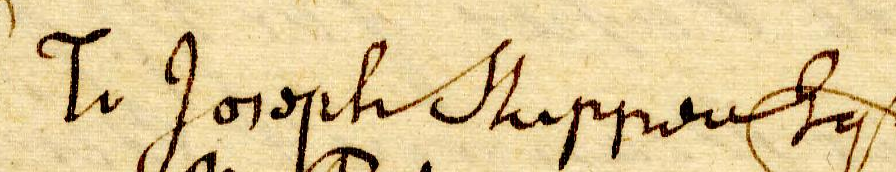To Joseph Shippen Eq^r.
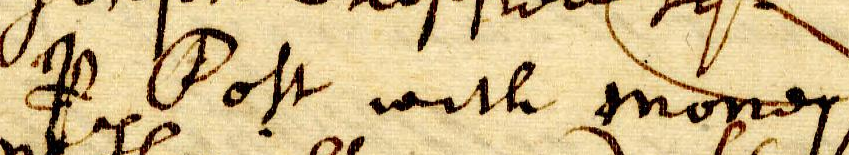per Post with Money
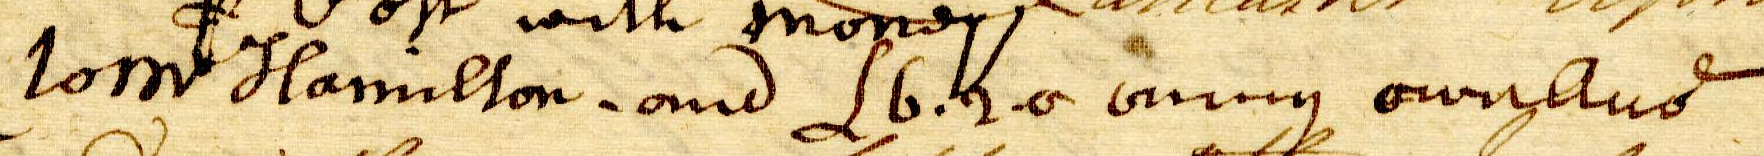to M^r Hamilton- £6.2.0 on my Acco^t
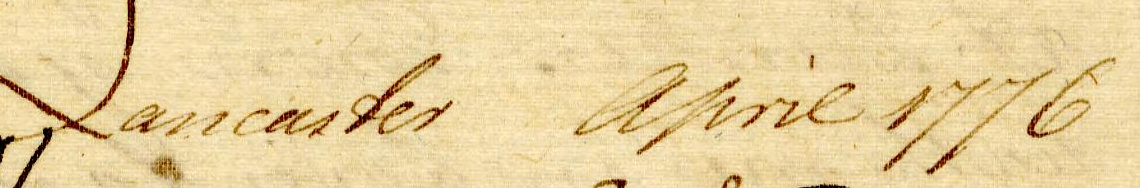Lancaster April 1776
